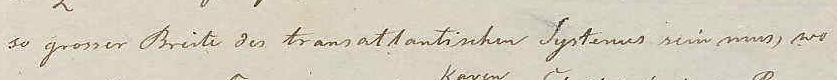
so grosser Breite des transatlantischen Systems sein mus, wo
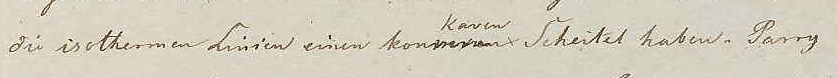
die isothermen Linien einen konvexenkaven Scheitel haben. Parry
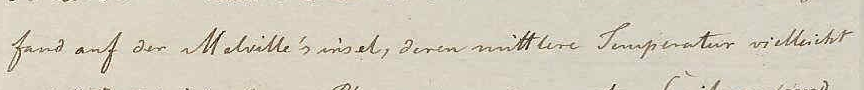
fand auf der Melville's insel, deren mittlere Temperatur vielleicht
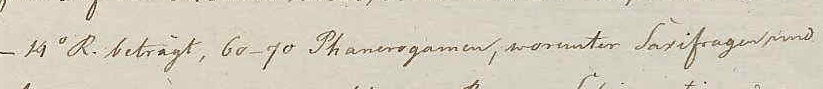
−14° R. beträgt, 60–70 Phanerogamen, worunter Saxifragen und
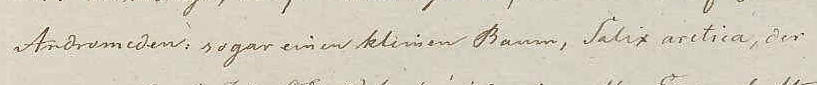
Andromeden: sogar einen kleinen Baum, Salix arctica, der
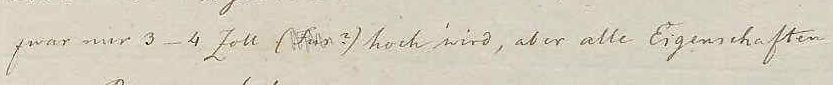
zwar nur 3–4 Zoll hoch wird, aber alle Eigenschaften
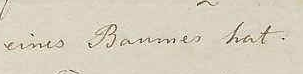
eines Baumes hat.
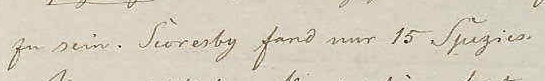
zu sein. Scoresby fand nur 15 Spezies.
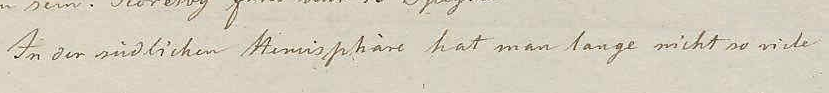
In der südlichen Hemisphäre hat man lange nicht so viele
